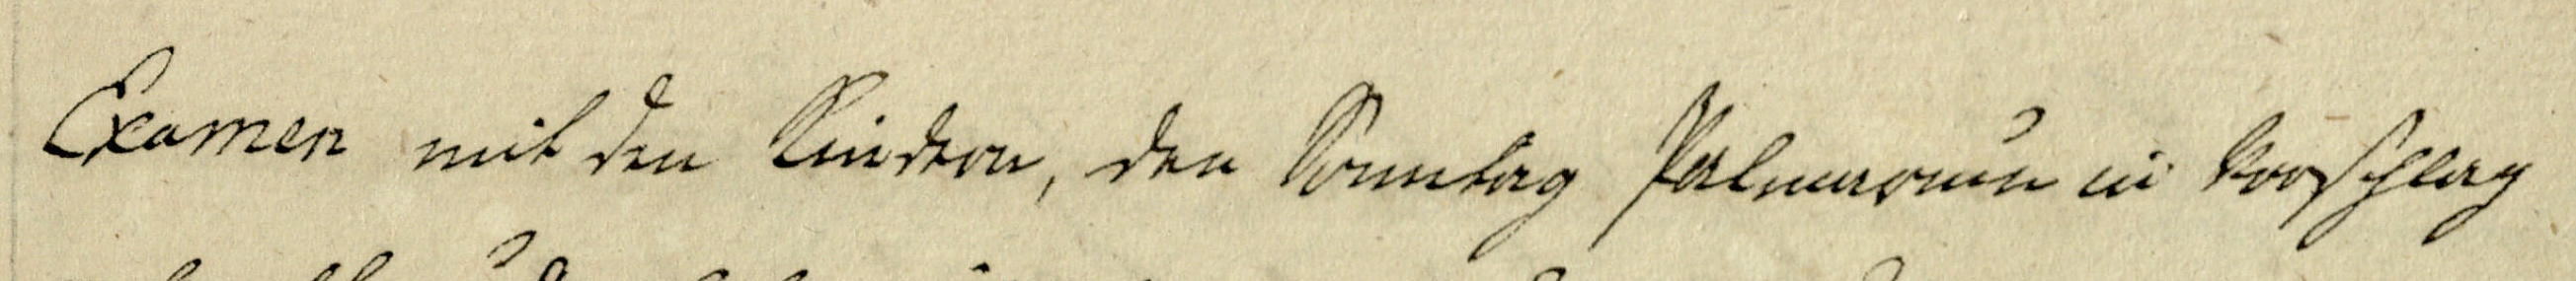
Examen mit den Kindern, den Sonntag Palmarum in Vorschlag
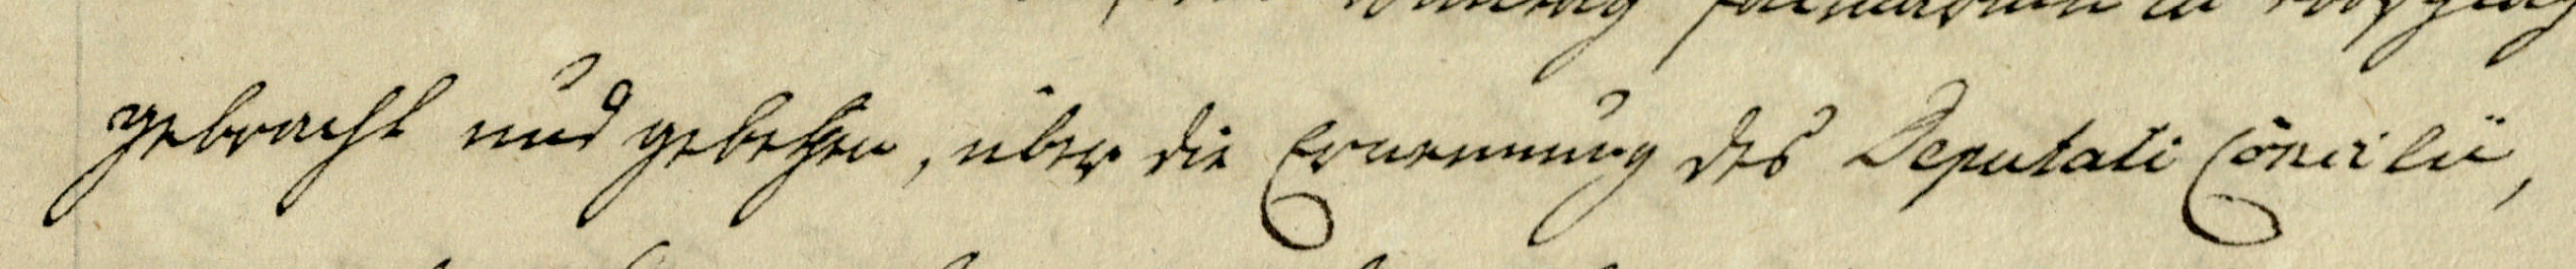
gebracht und gebethen, über die Ernennung des Deputati Concilii,
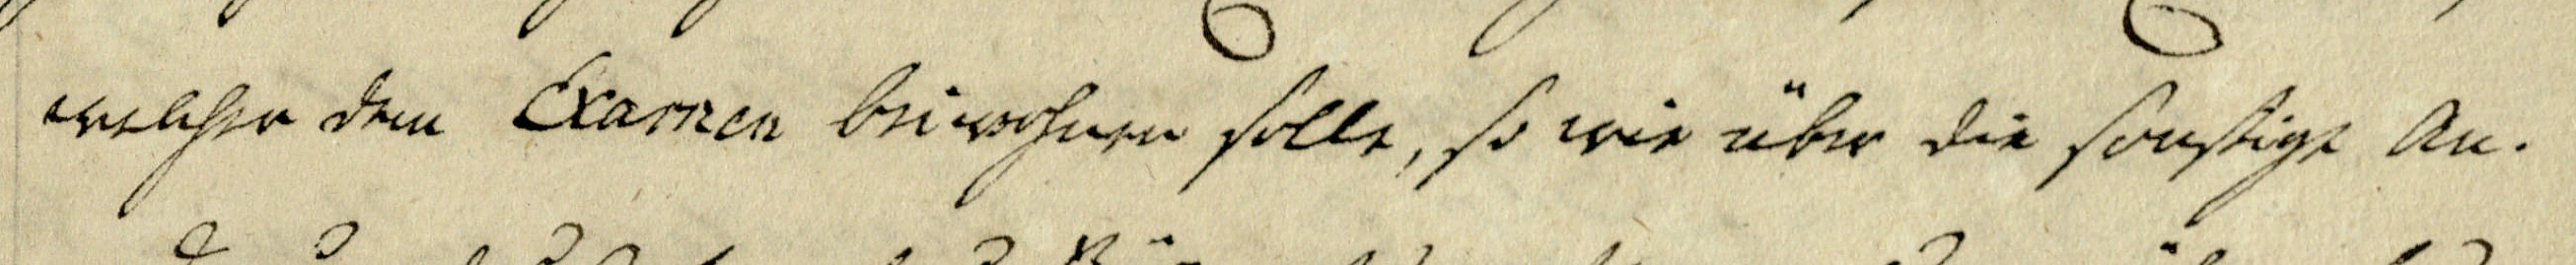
welcher dem Examen beiwohnen solle, so wie über die sonstige An¬
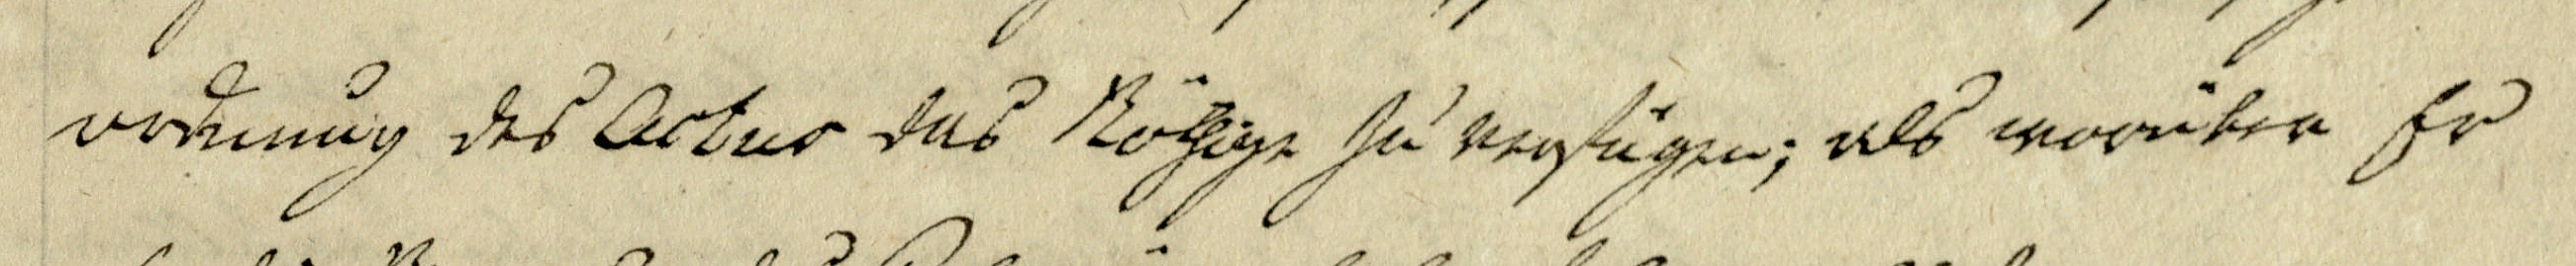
ordnung des Actus das Nöthige zu verfügen, als worüber Er
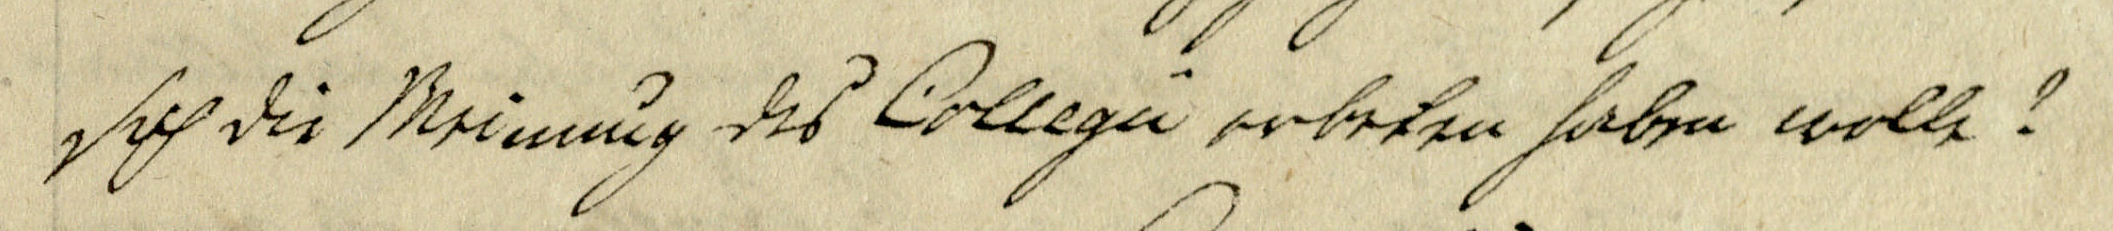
sich die Meinung des Collegii erbeten haben wolle?
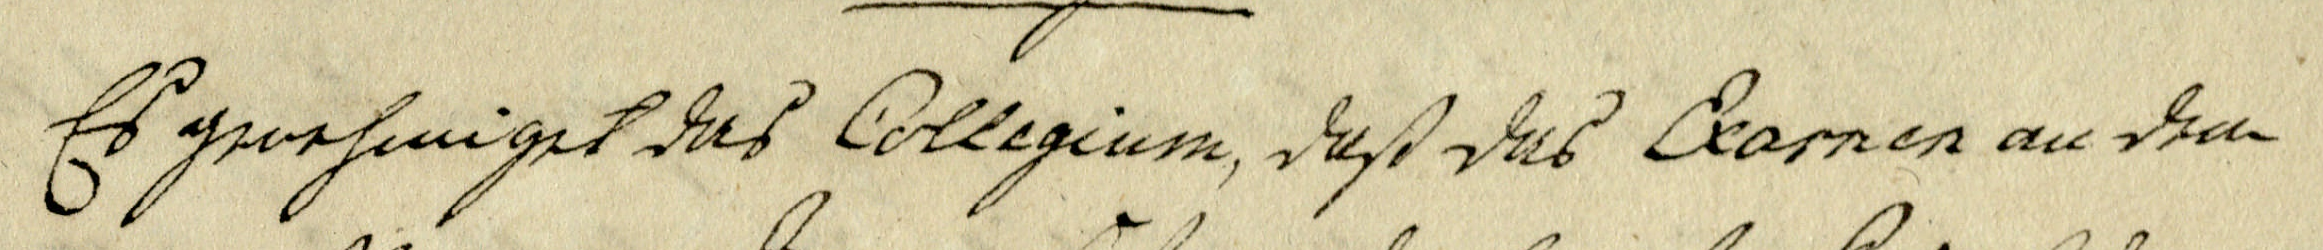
Es genehmiget das Collegium, daß das Examen an dem
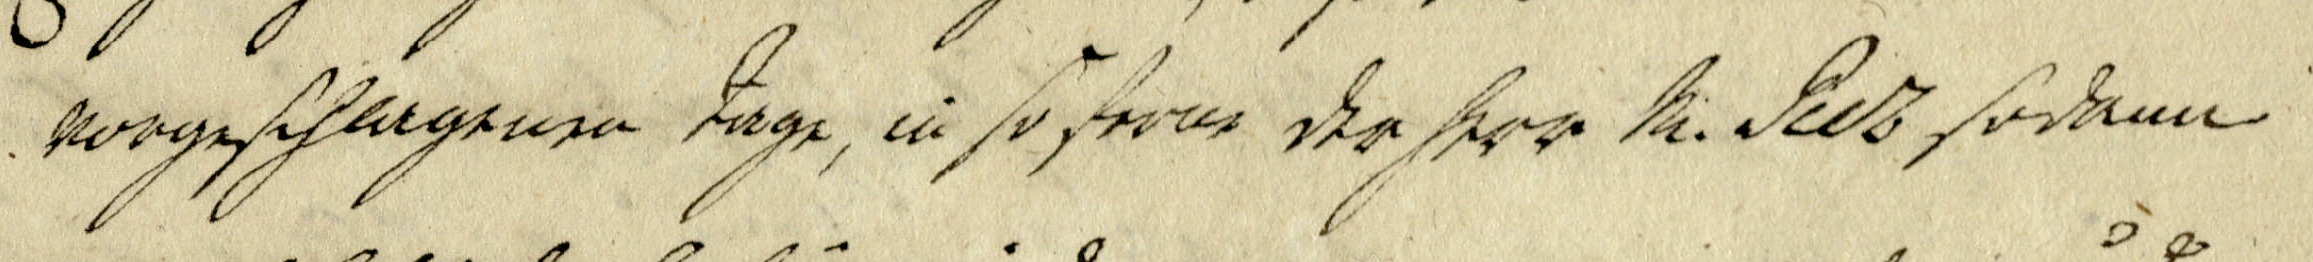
vorgeschlagenen Tage, in so ferne der Herr M. Pelz sodann
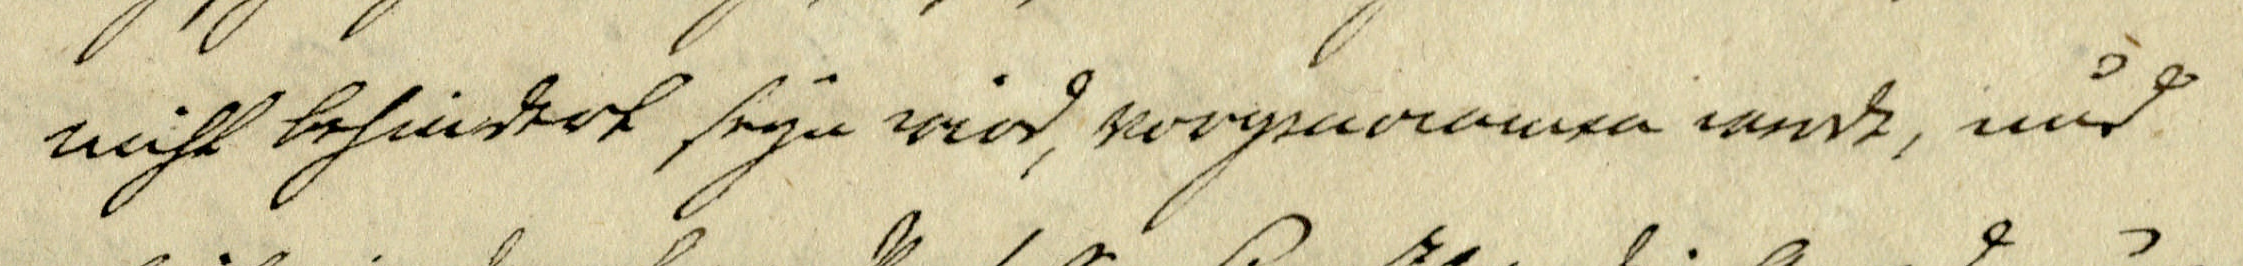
nicht behindert seÿn wird, vorgenommen werde, und
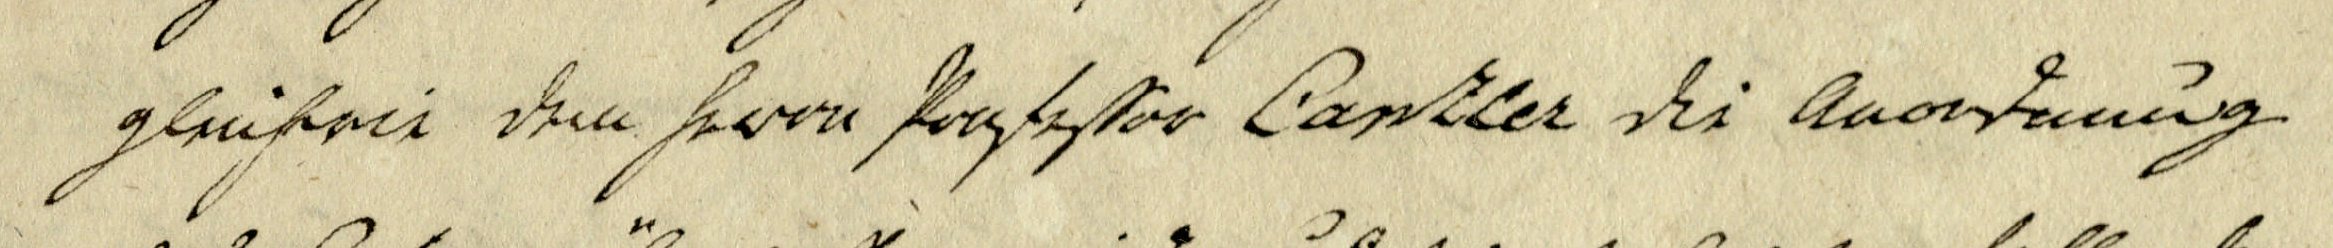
gleichwie dem Herrn Professor Canzler die Anordnung
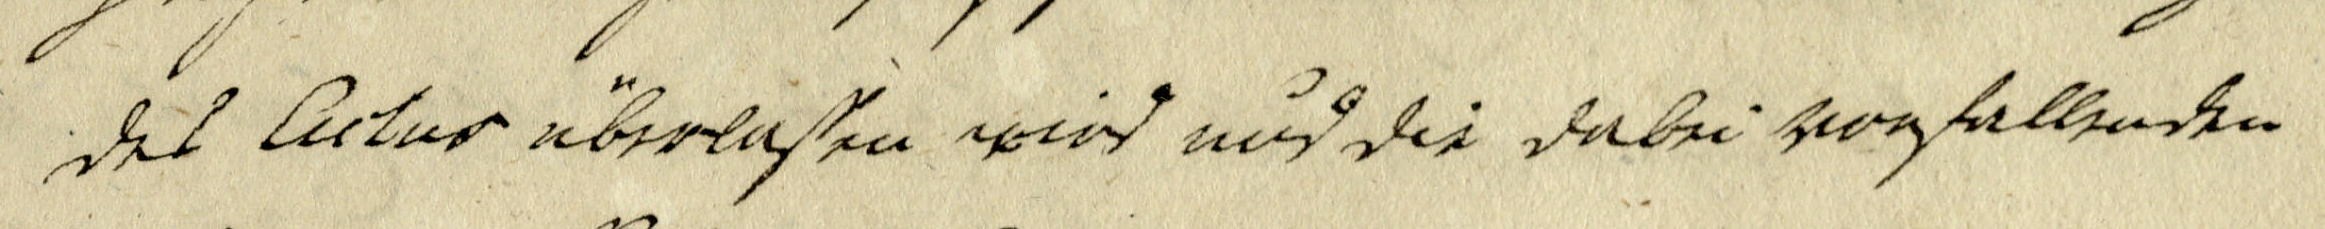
des Actus überlassen wird und die dabei vorfallenden
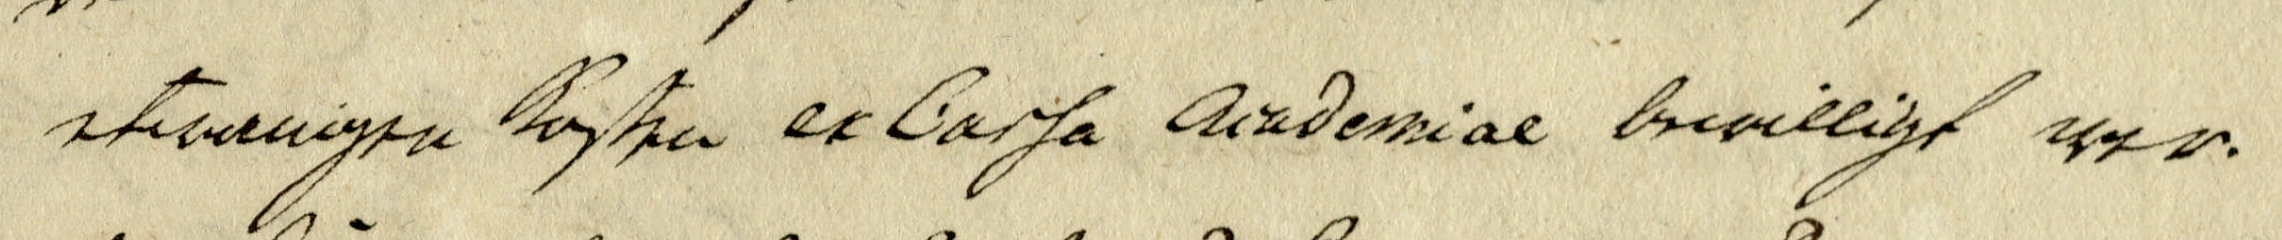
etwanigen Kosten ex Cassa Academiae bewilligt wer¬
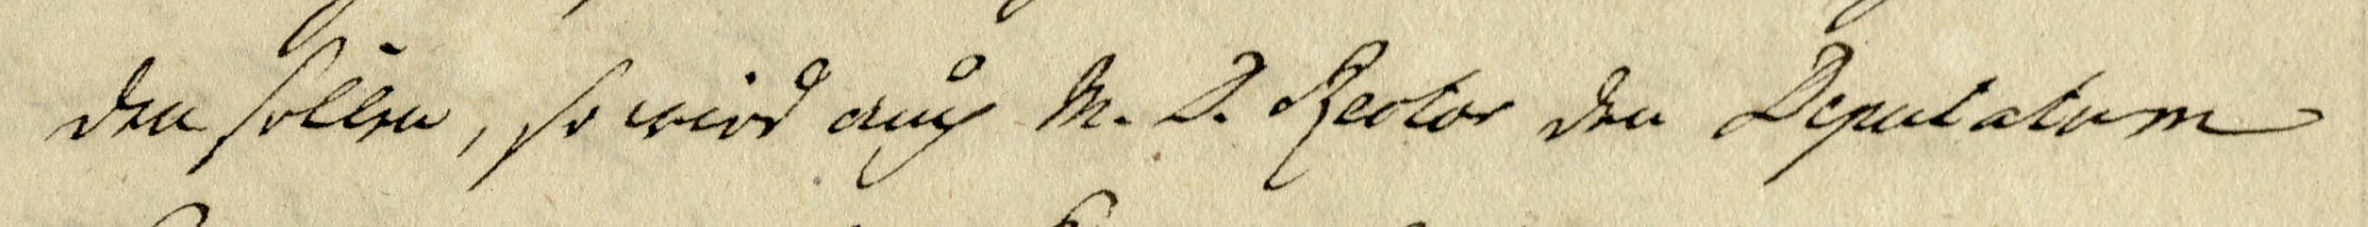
den sollen, so wird auch M. D. Rector den Deputatum
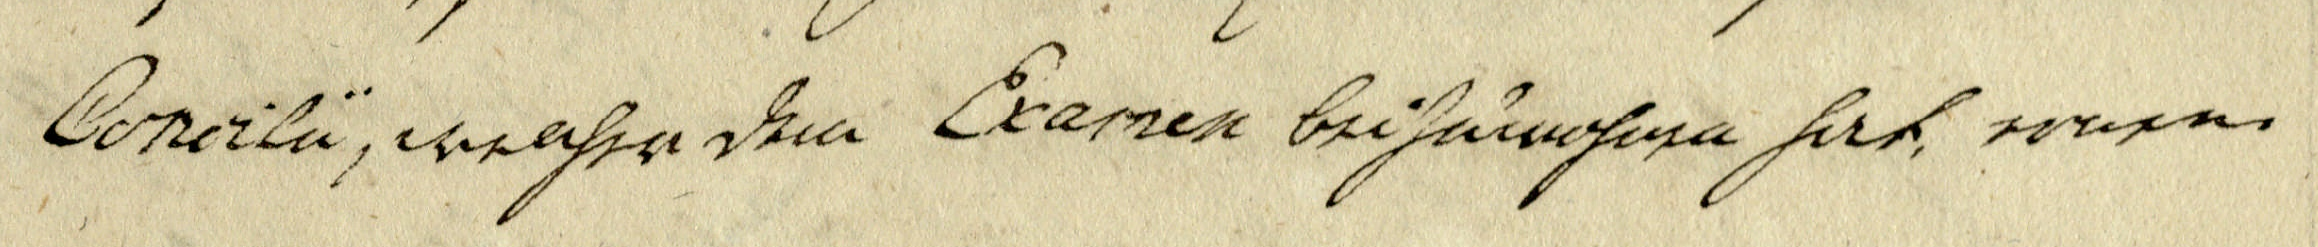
Concilii, welcher dem Examen beizuwohnen hat, ernen¬
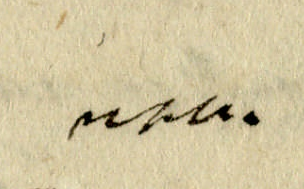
nen.
